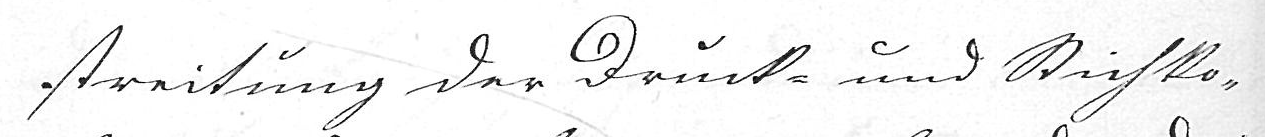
streitung der Druck- und Stichko-
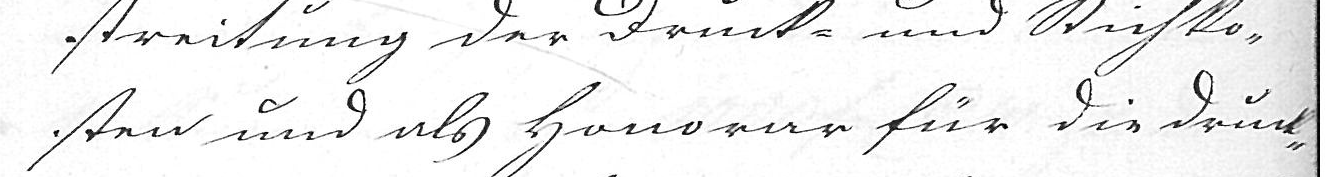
sten und als Honorar für die Druck-
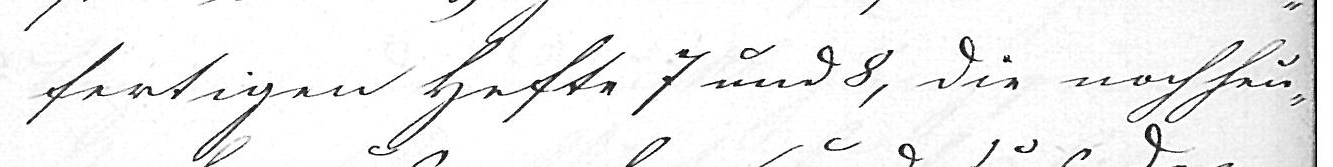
fertigen Hefte 7 und 8, die noch heu-
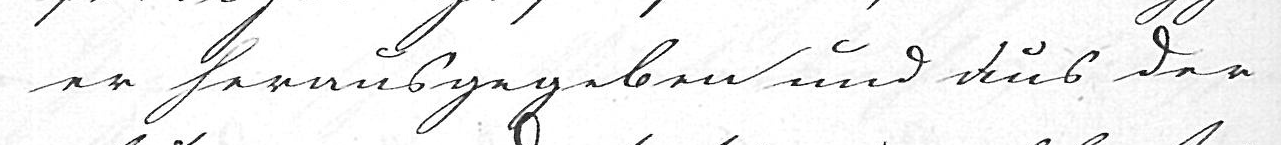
er herausgegeben und aus der
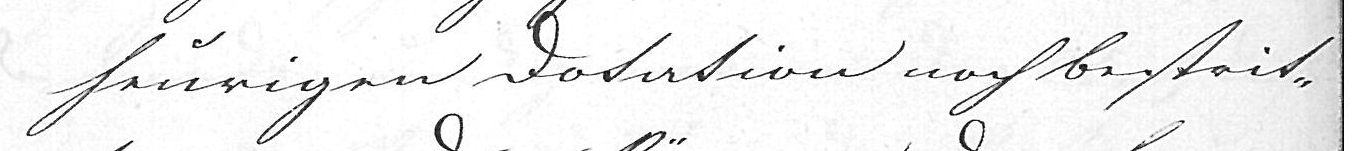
heurigen Dotation noch bestrit-
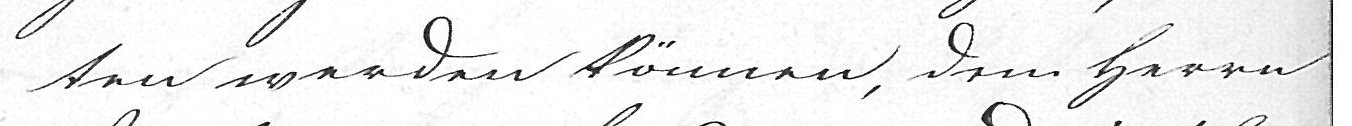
ten werden können, dem Herrn
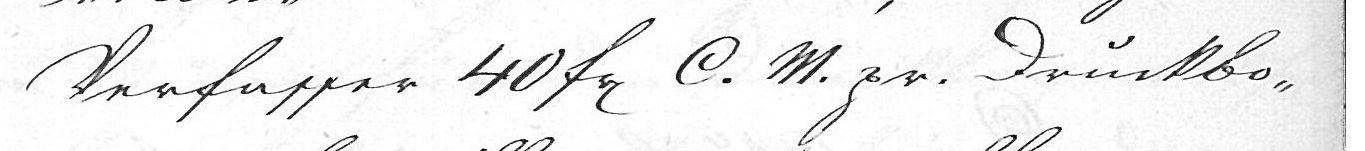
Verfasser 40 fl. C. M. pr- Druckbo-
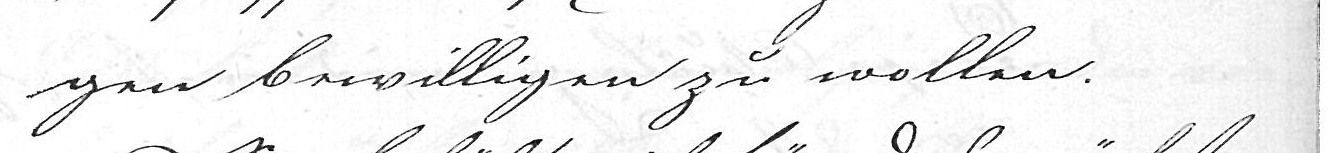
gen bewilligen zu wollen.
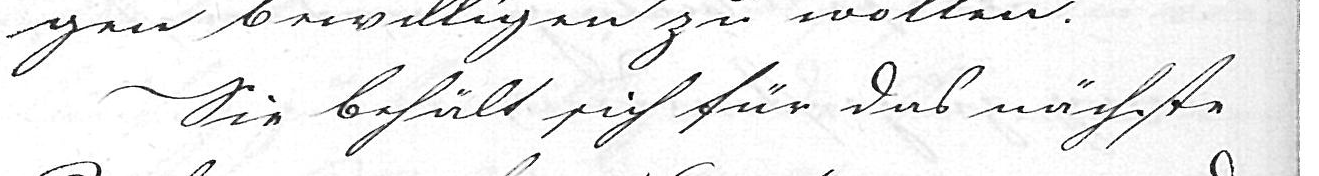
Sie behält sich für das nächste
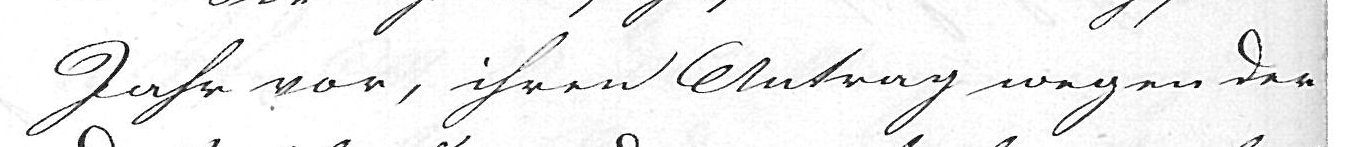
Jahr vor, ihren Antrag wegen der
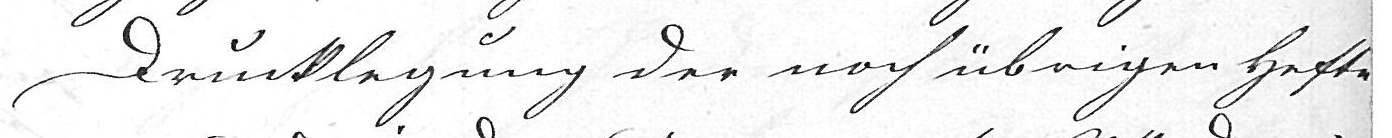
Drucklegung der noch übrigen Hefte
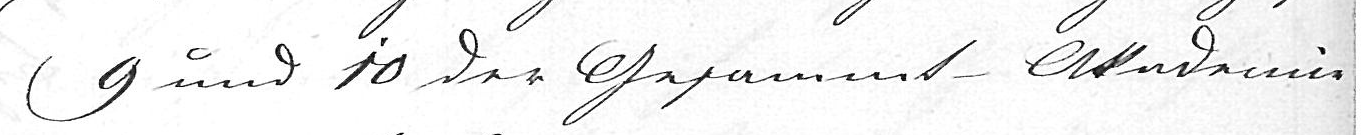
9 und 10 der Gesammt-Akademie
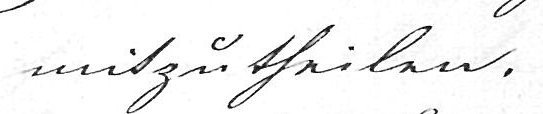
mitzutheilen.
